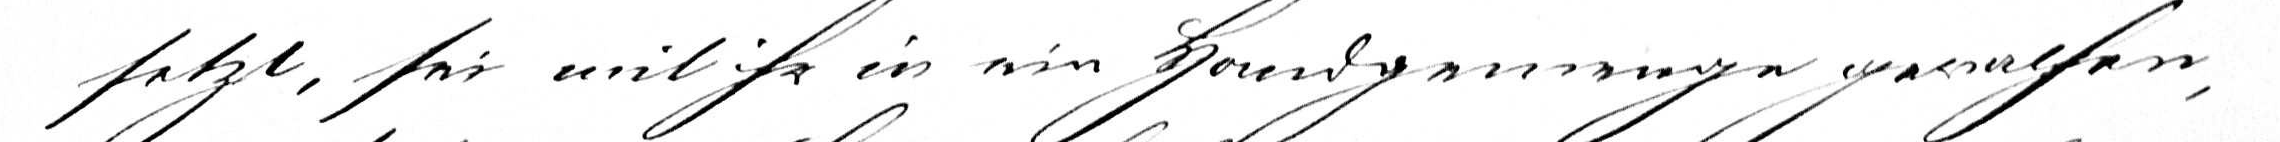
setzt, sei mit ihr in ein Handgemenge gerathen,
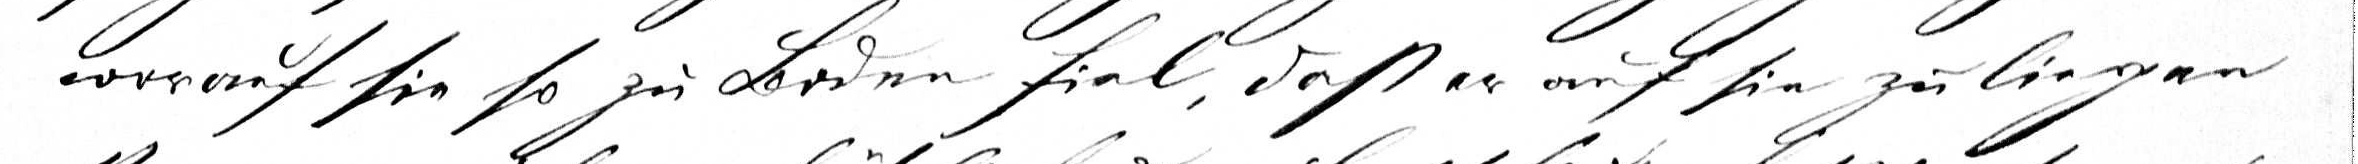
worauf sie so zu Boden fiel, daß er auf sie zu liegen
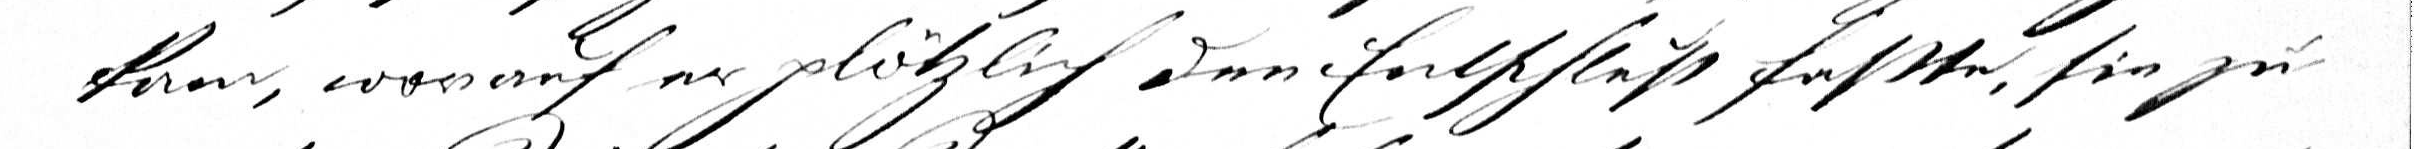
kam, worauf er plötzlich den Entschluß faßte, sie zu
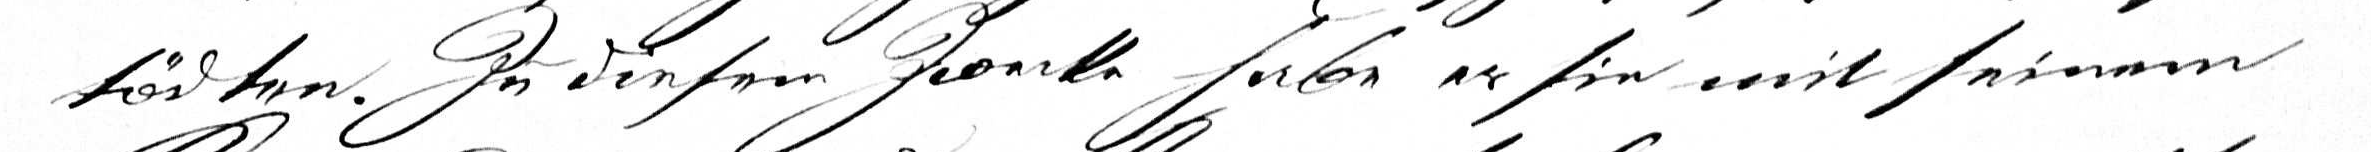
tödten. Zu diesem Zwecke habe er sie mit seinem
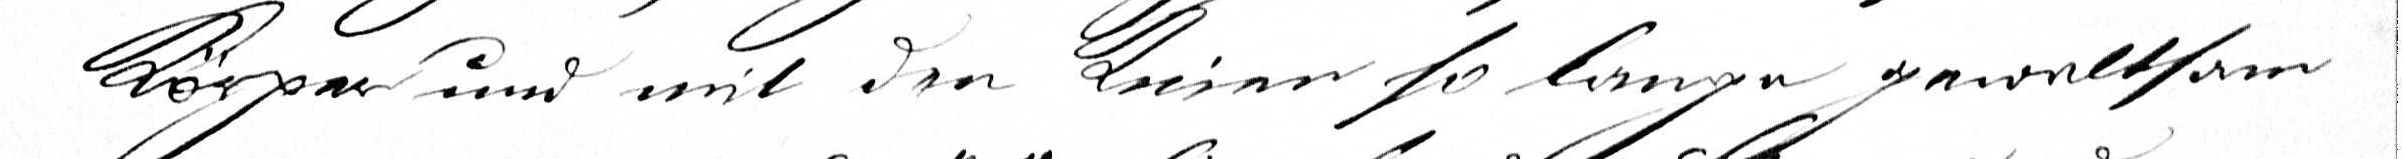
Körper und mit den xx so lange gewaltsam
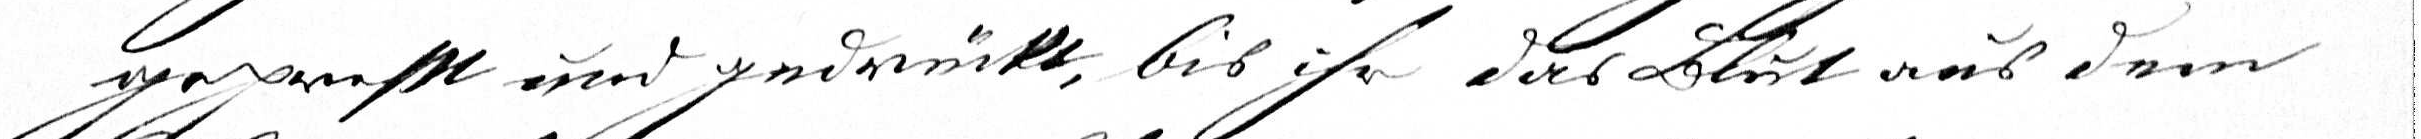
gepreßt und gedrückt, bis ihr das Blut aus dem
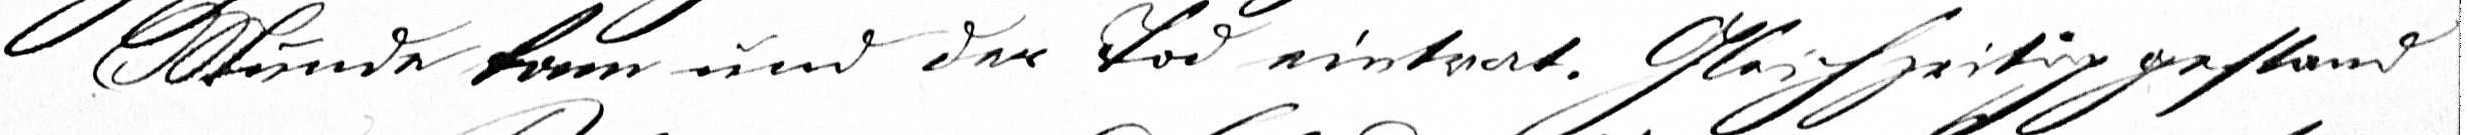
Stunde kam und der Tod eintrat. Gleichzeitig gestand
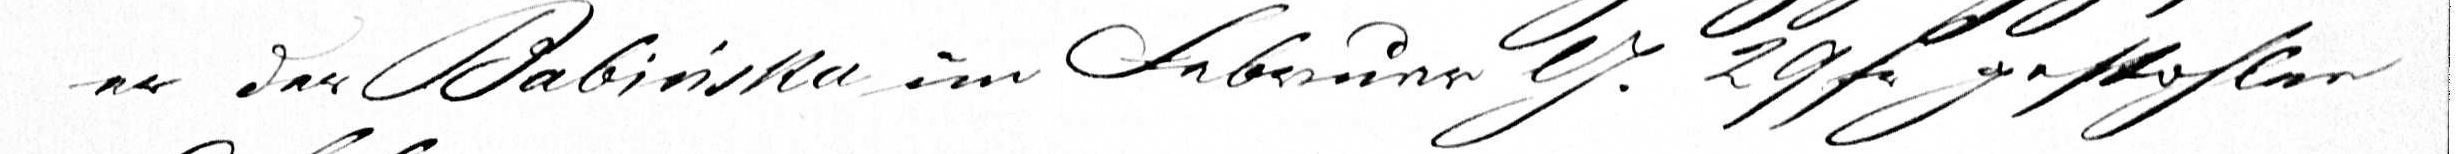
er der Babińska im Februar lJ. 29 fr gestohlen
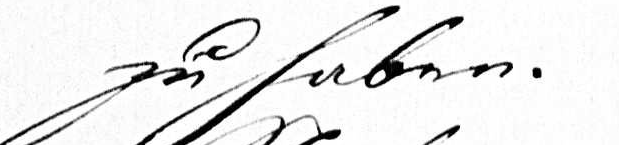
zu haben.
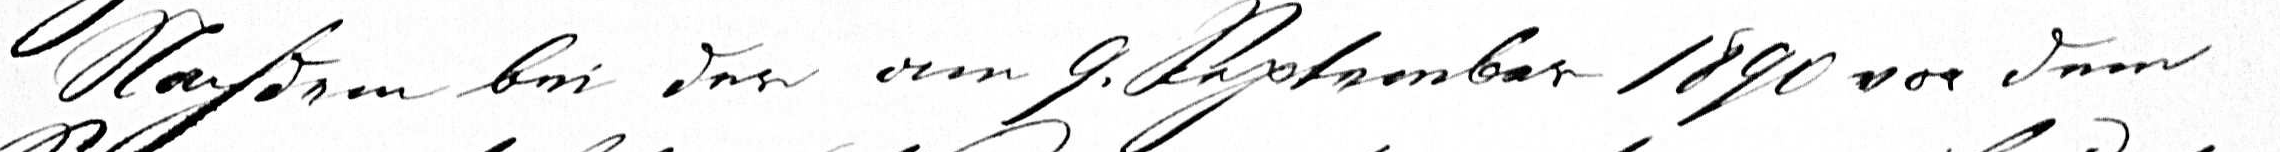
Nachdem bei der am 9. September 1890 vor dem
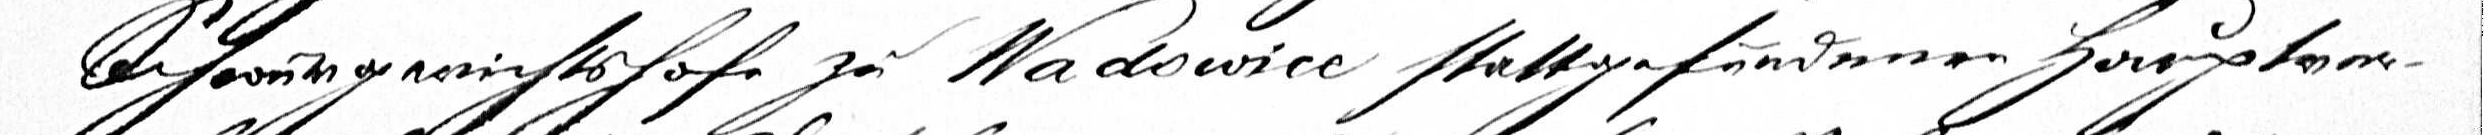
Schwurgerichtshofe zu Wadswice stattgefundenen Haupt¬
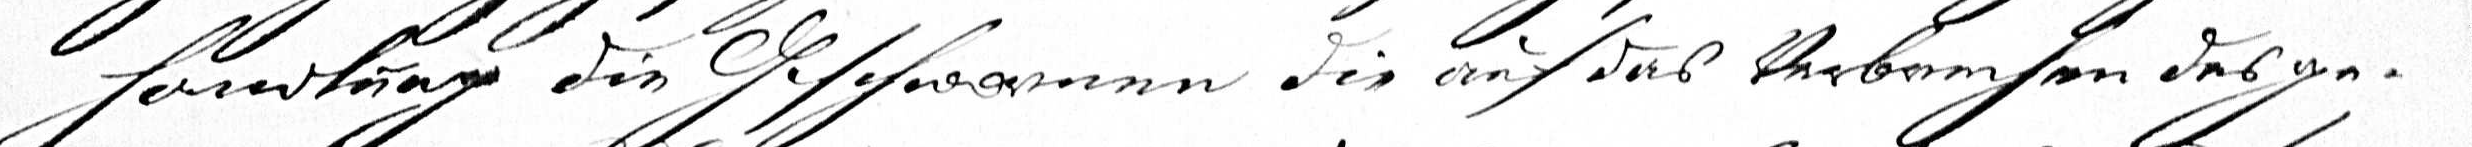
verhandlung die Gschwarnen die auf das Verbrechen des ge¬
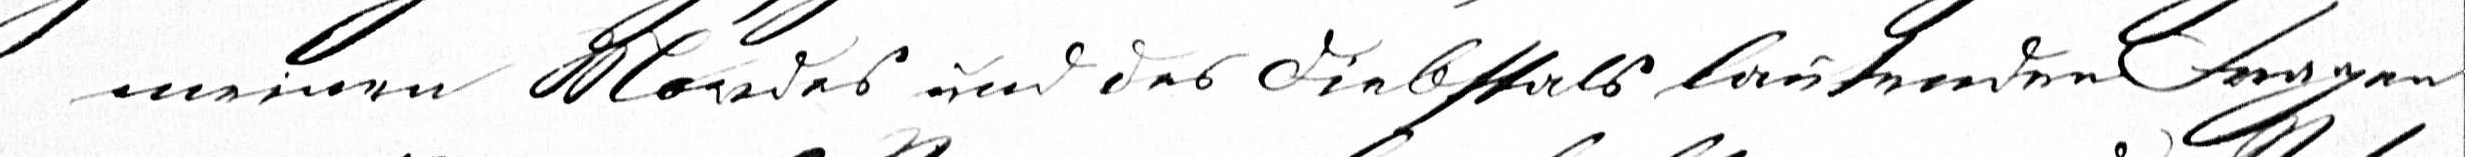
meinen Mordes und des Diebstals lautenden Fragen
